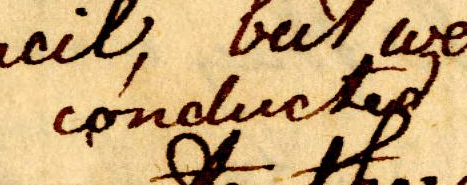conducted
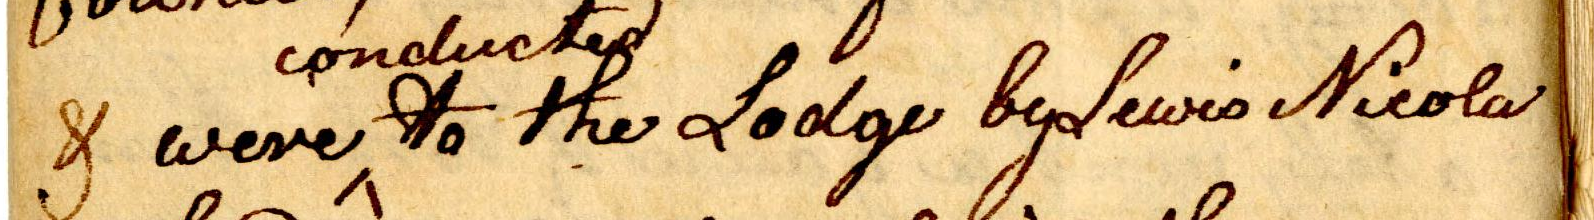& were ^ to the Lodge by Lewis Nicola
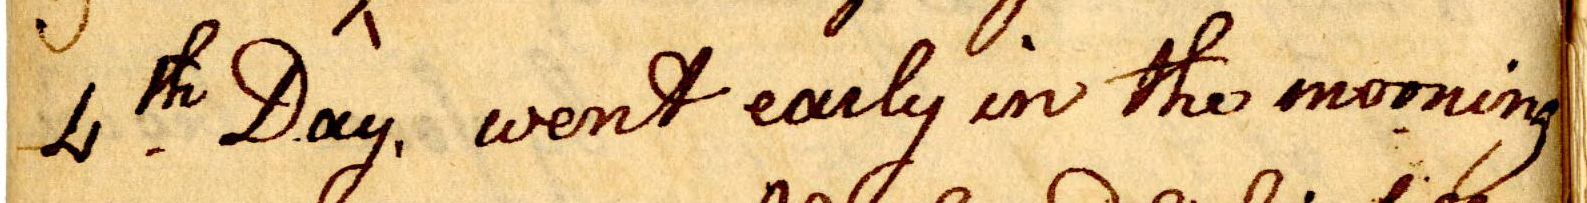4^th Day, went early in the morning
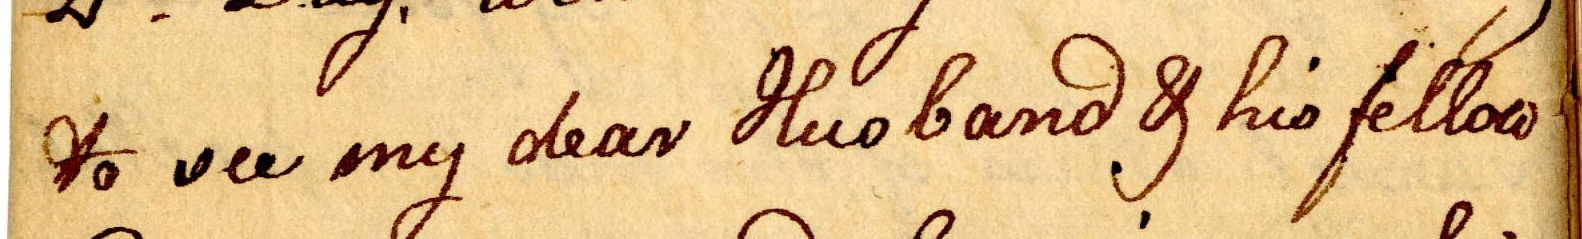to see my dear Husband & his fellow
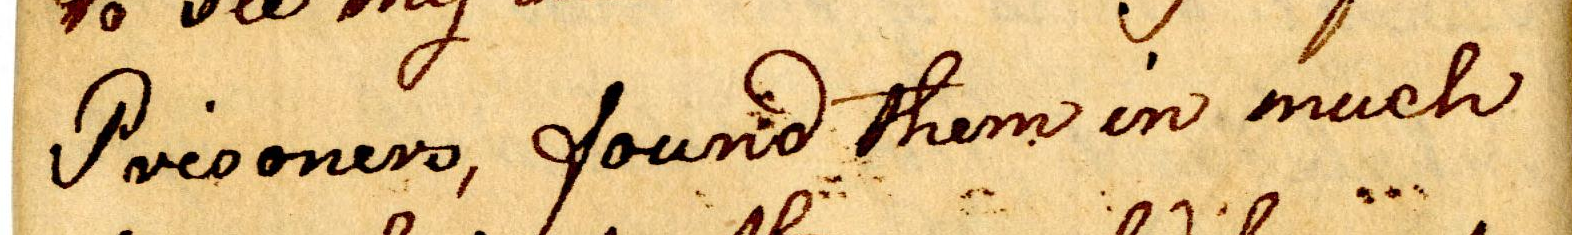Prisoners, found them in much
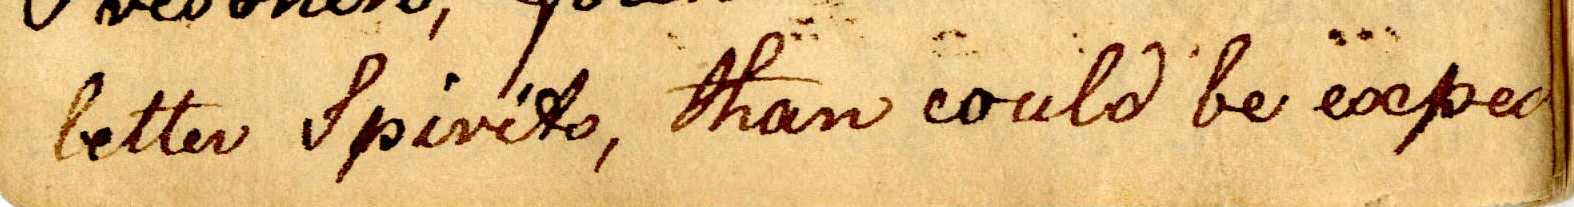better Spirits, than could be expec
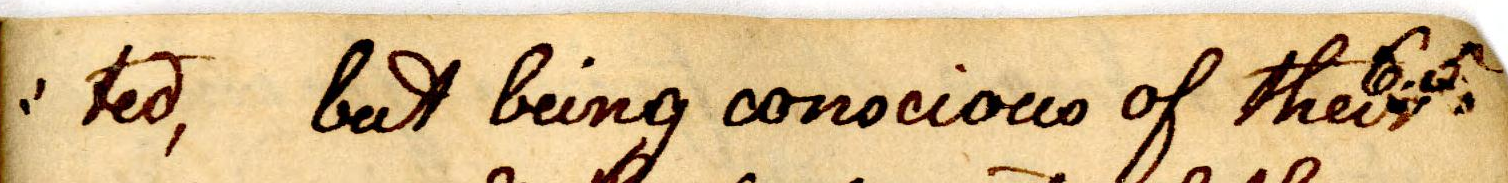-ted, but being conscious of their
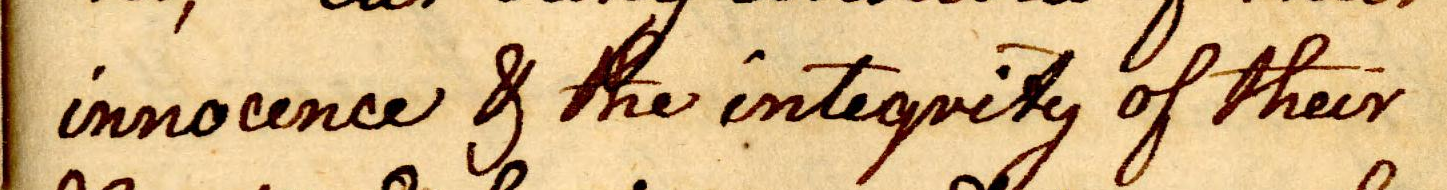innocence & the integrity of their
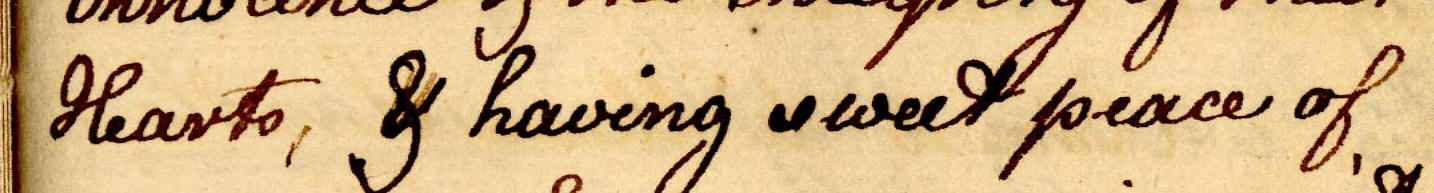Heart, & having sweet peace of
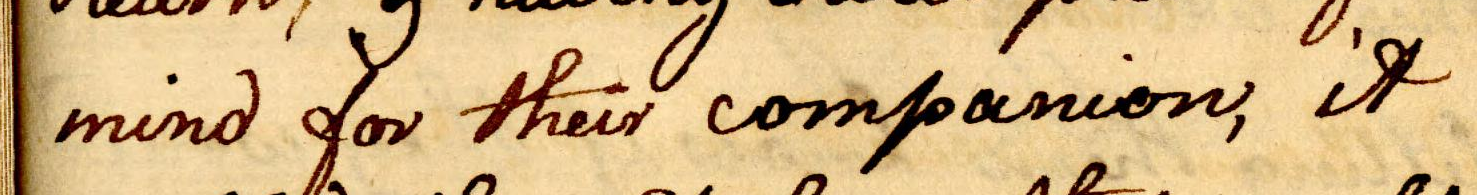mind for their companion, it
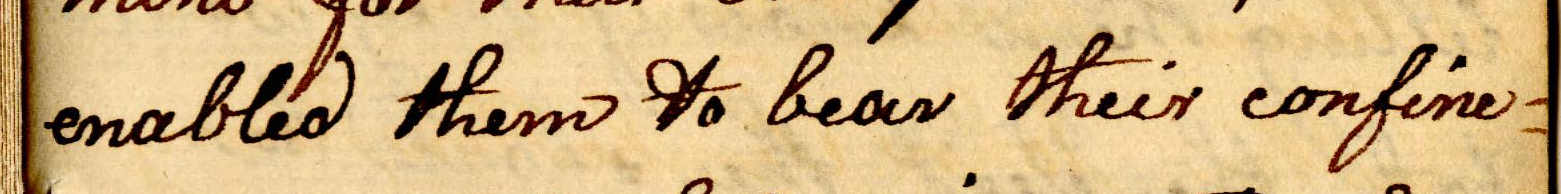enabled them to bear their confine-
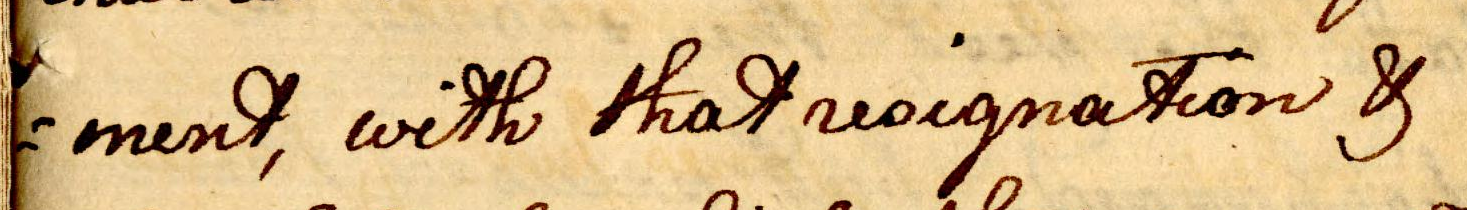-ment, with that resignation &
